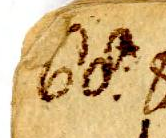68
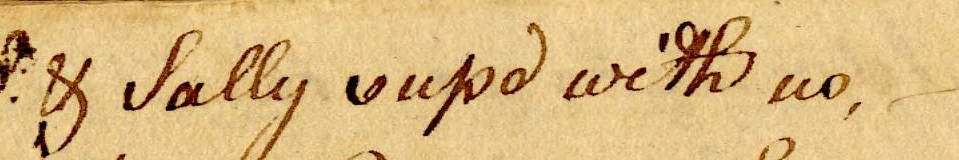& Sally supd with us,
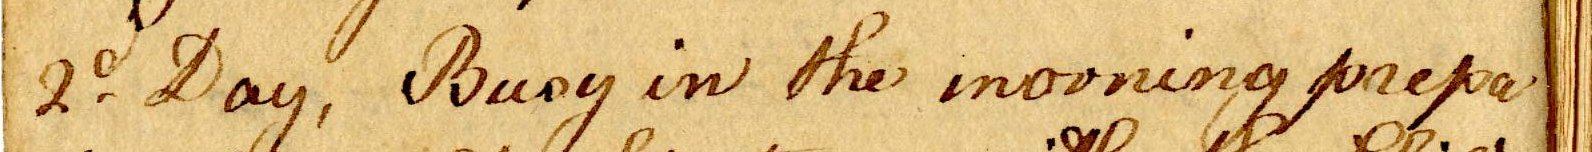2^d. Day, Busy in the morning prepa
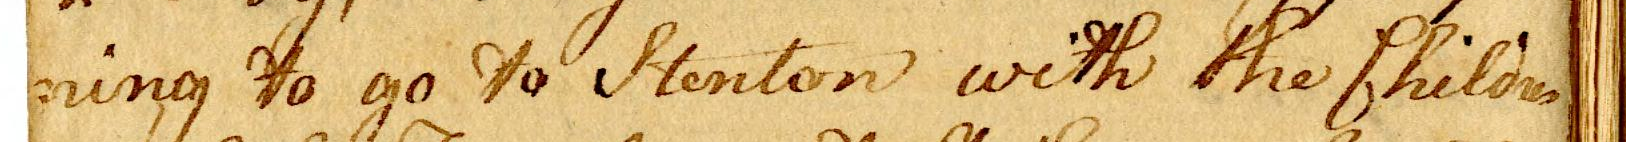-ring to go to Stenton with the Children
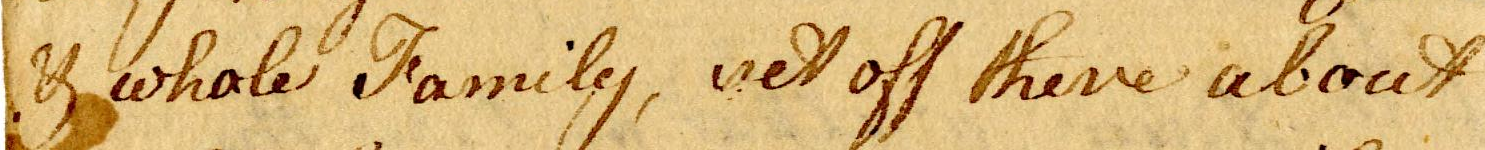& whole Family, set off there about
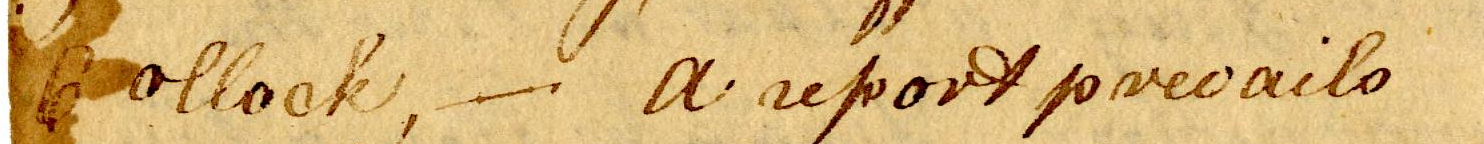6^o Clock-- A report prevails
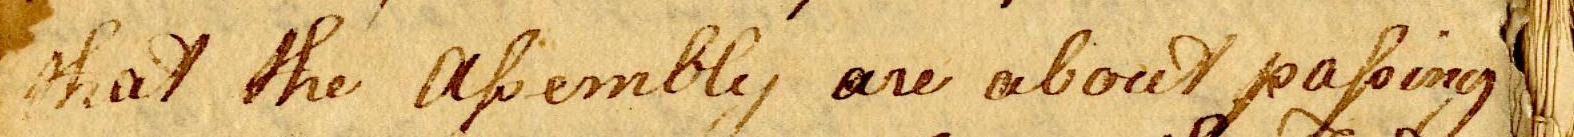that the Assembly are about passing
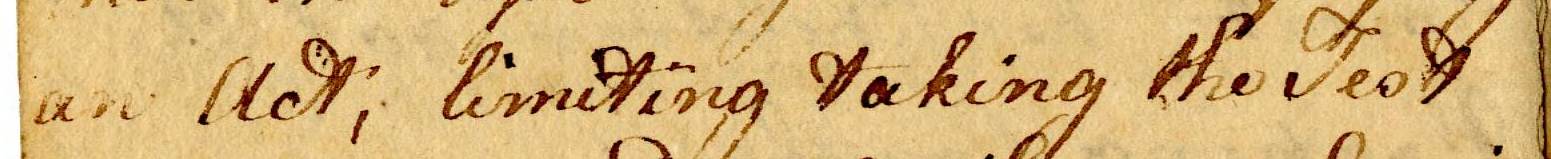an Act, limiting taking the Test
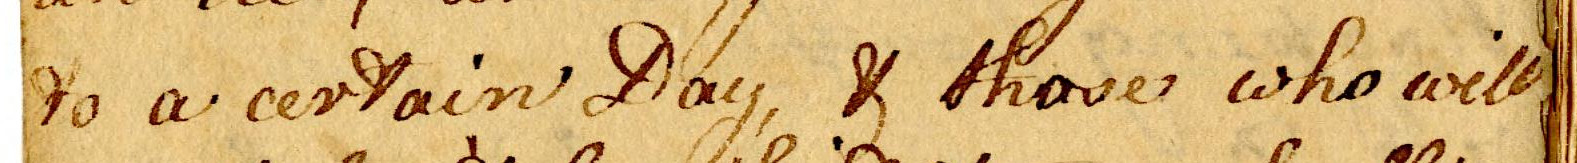to a certain Day, & those who will
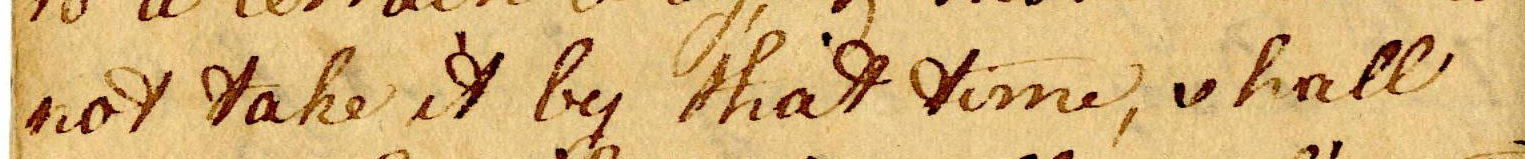not take it by that time, shall
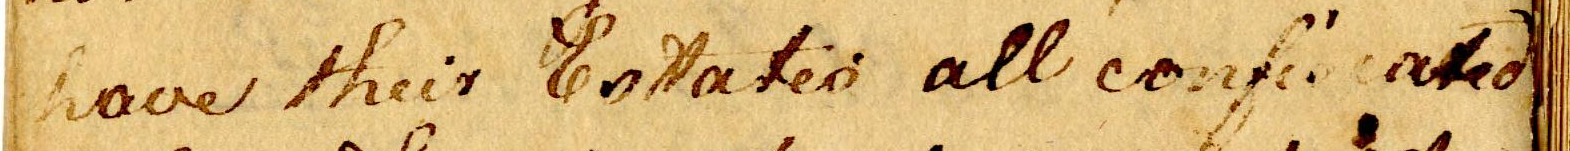have their Estates all confiscated
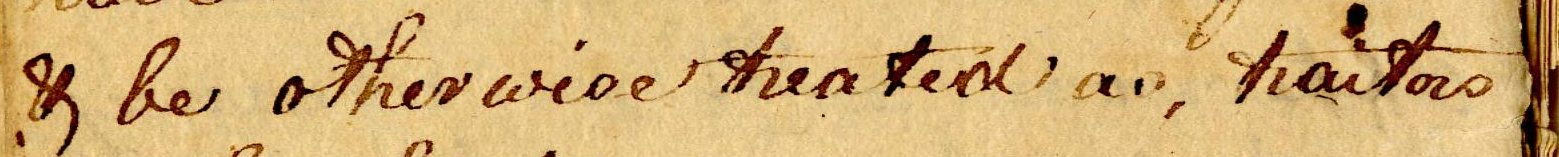& be otherwise treated as, traitors
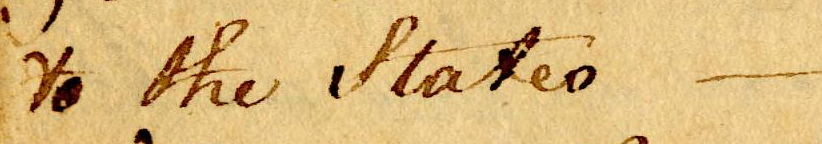to the States-
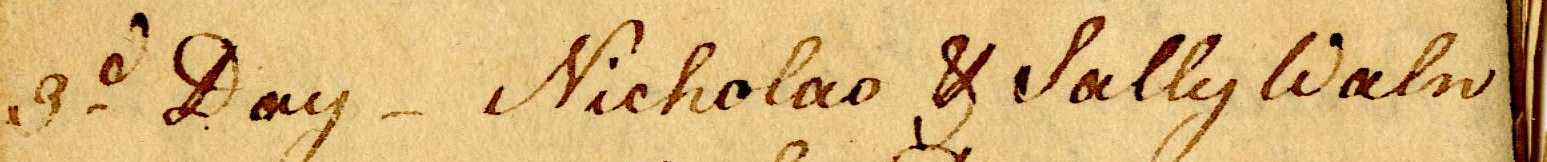3^d Day- Nicholas & Sally Waln
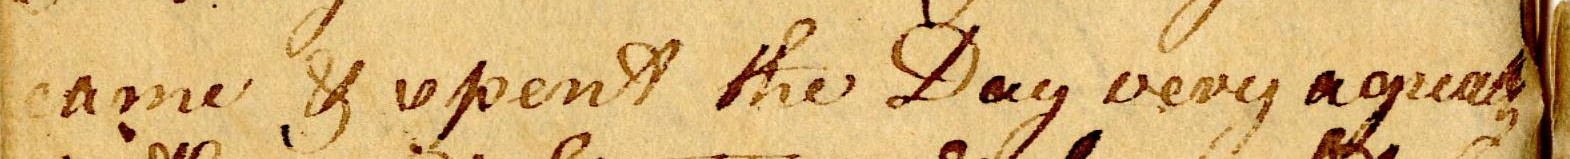came & spent the Day very agreably
